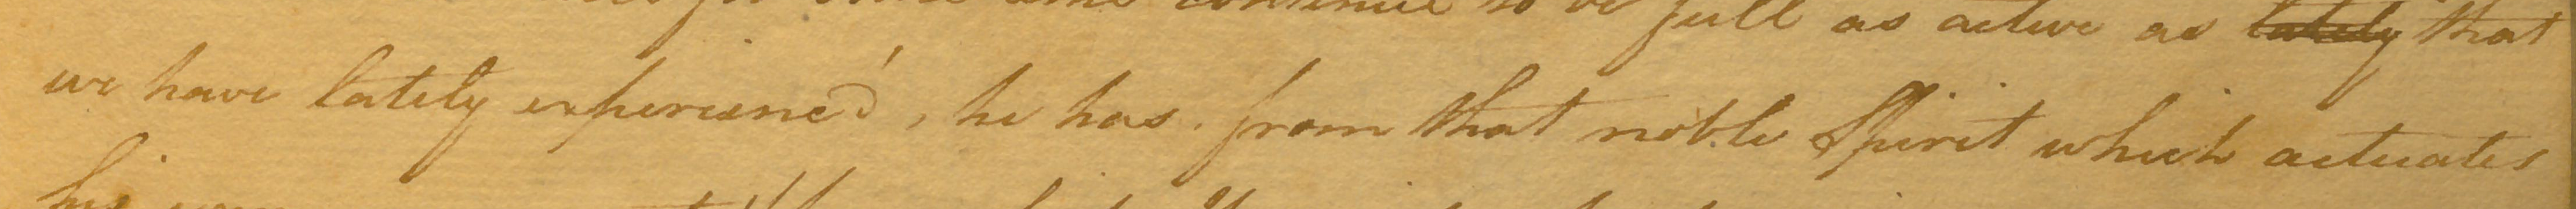we have lately experienc'd, he has from that noble Spirit which actuates
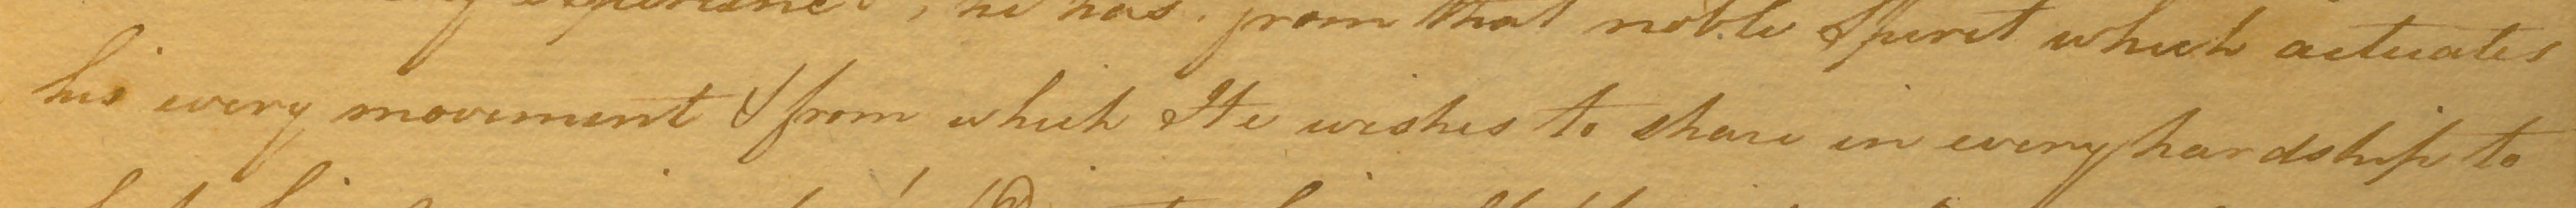his every movement & from which He wishes to share in every hardship to
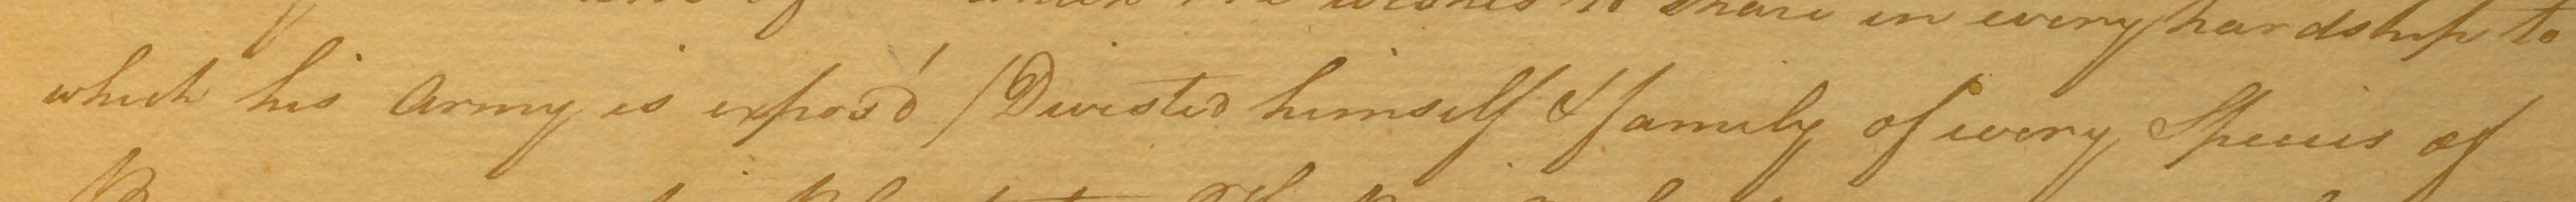which his Army is expos'd/ Divested himself & family of every Species of
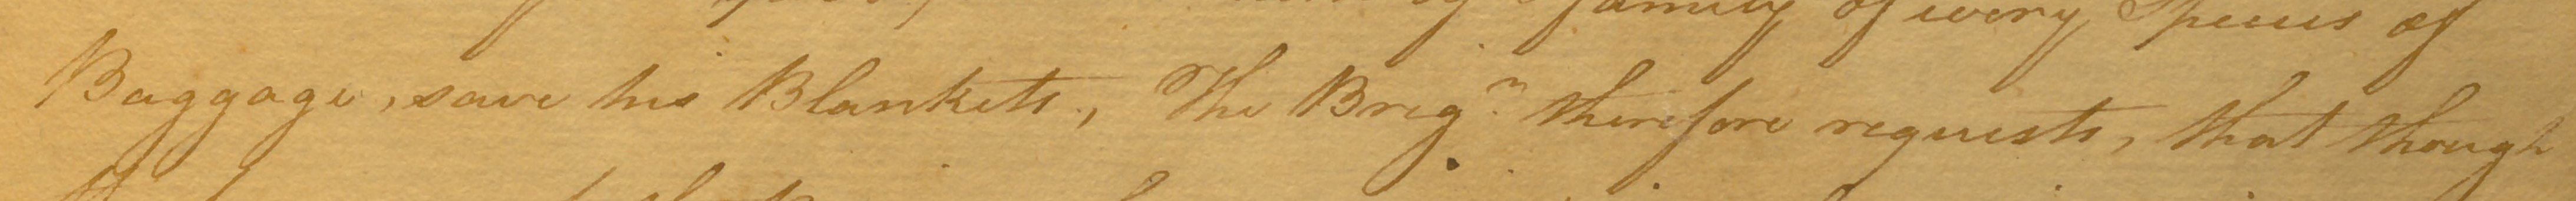Baggage, save his Blankets, The Brig^r therefore requests, that though
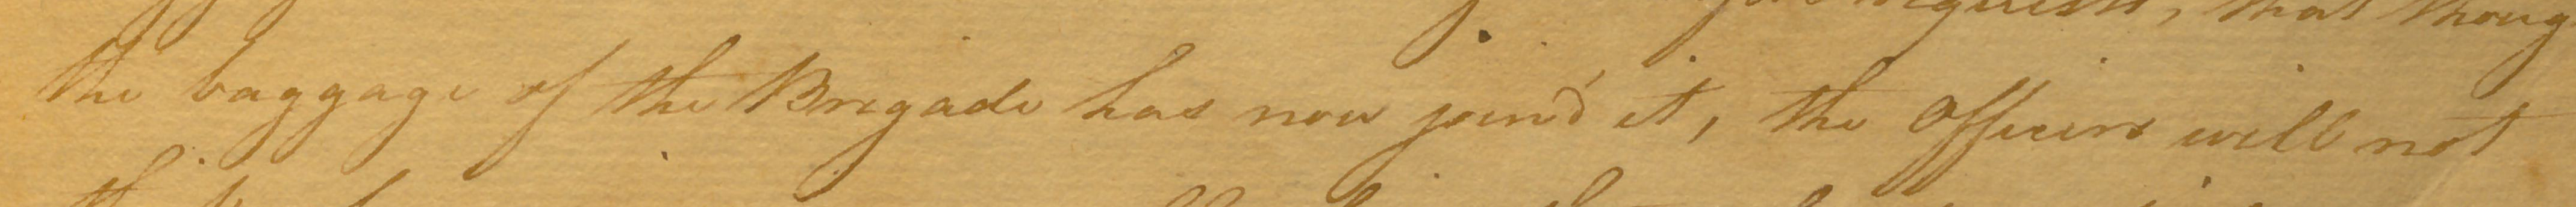the baggage of the Brigade has now join'd it, the Officers will not
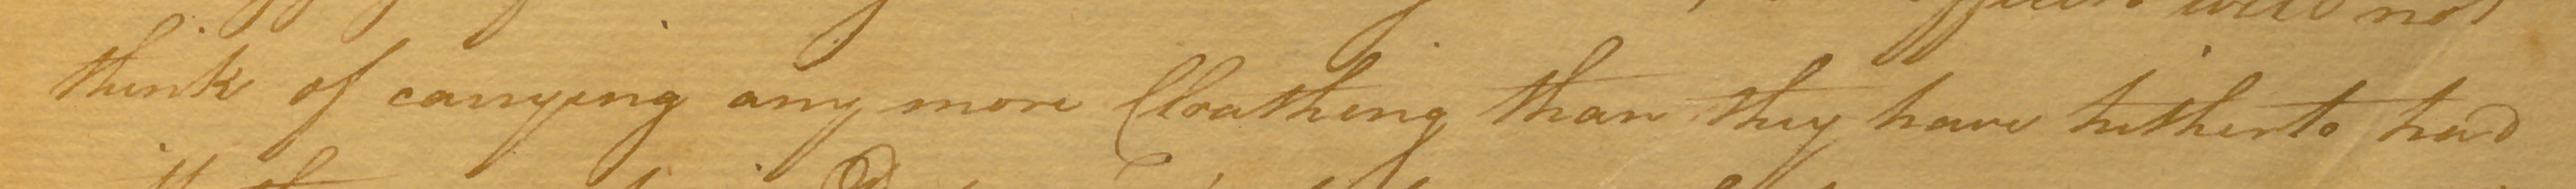think of carrying any more Cloathing than they have hitherto had
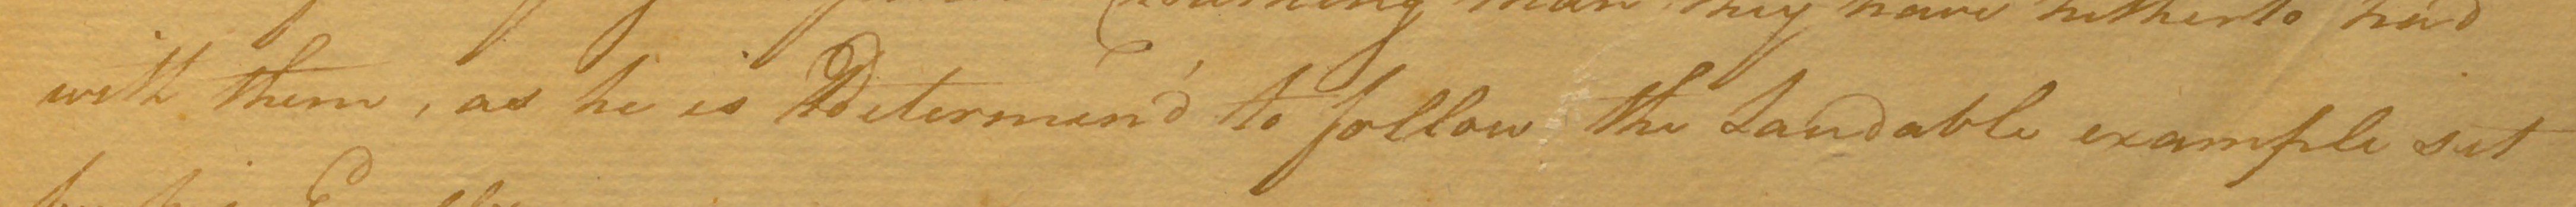with them, as he is Determin'd to follow the Laudable example set
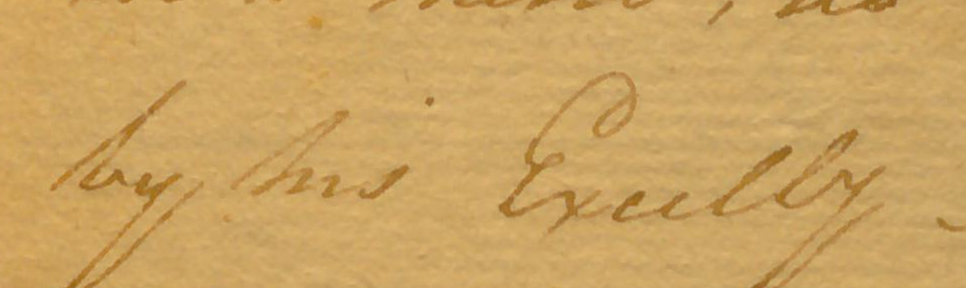by his Excelly
